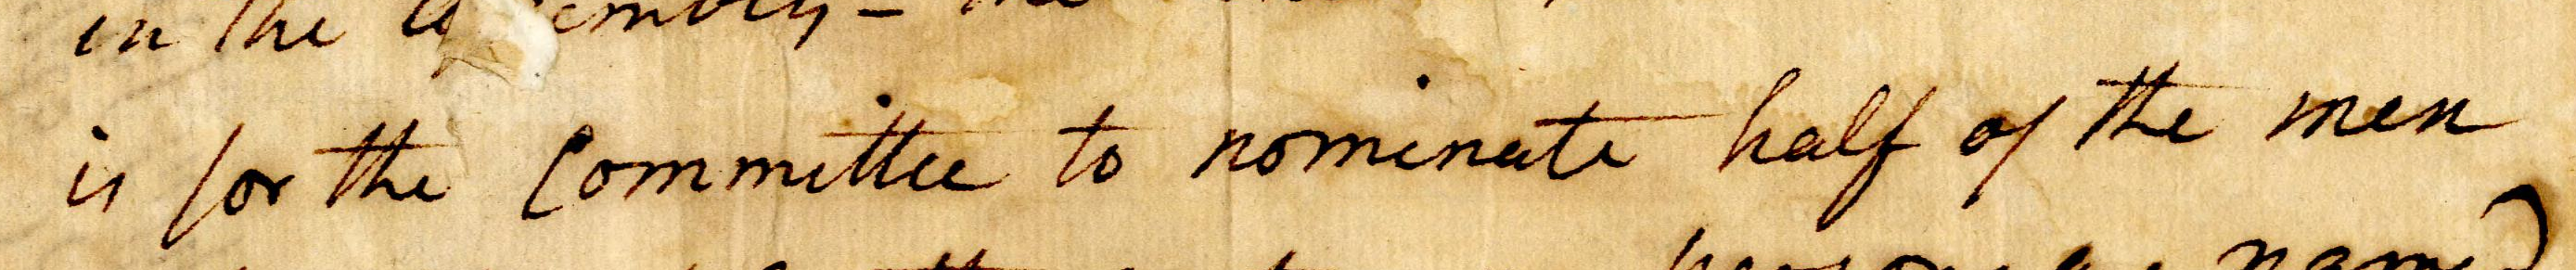is for the Committee to nominate half of the men
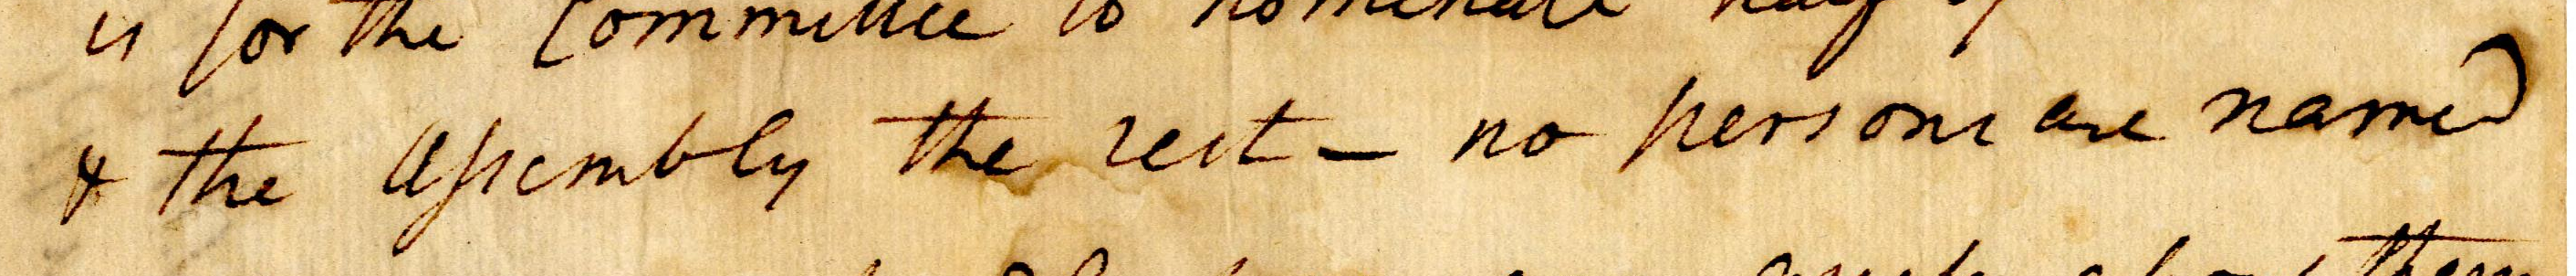& the Assembly the rest- no persons are named
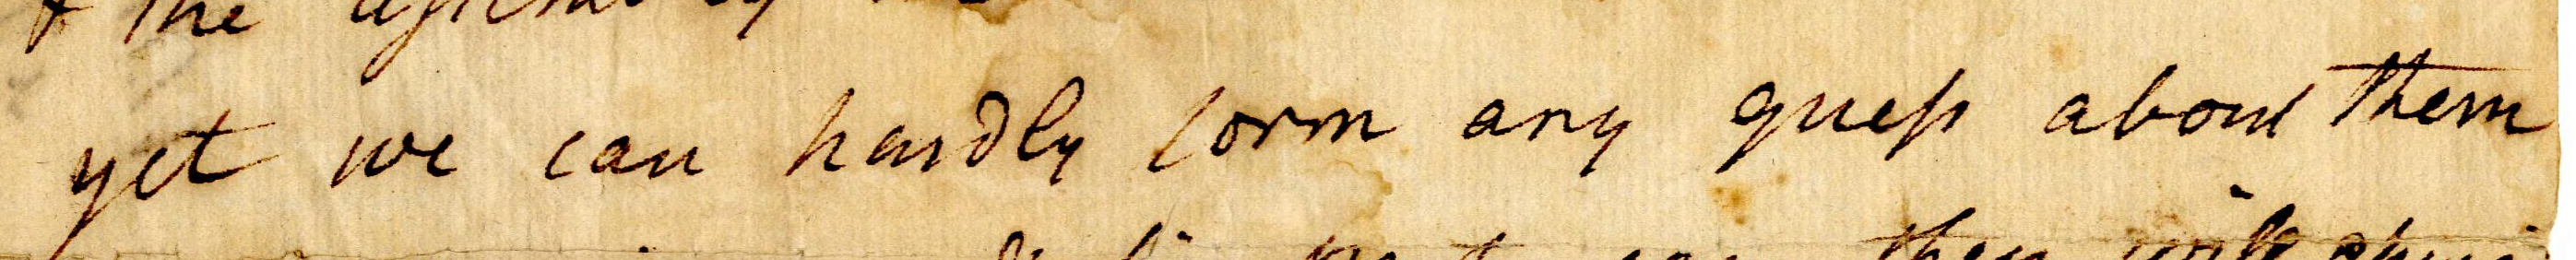yet we can hardly form any ques about them
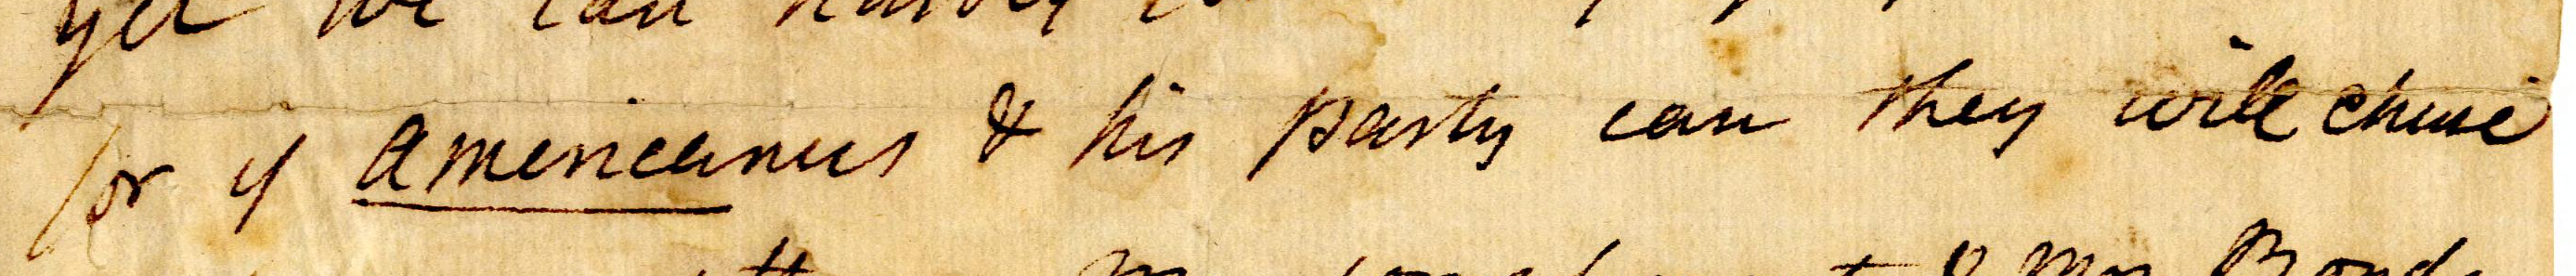for if Americanus & his party can they will [choose]
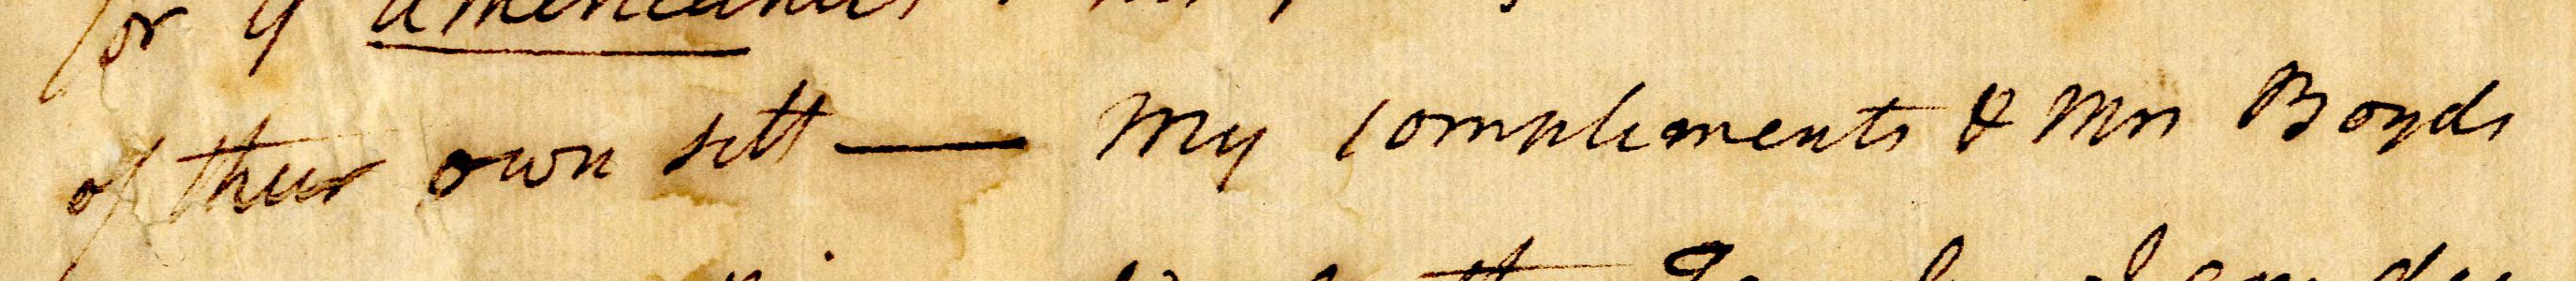of their own sett- My compliments & M^r Boyds
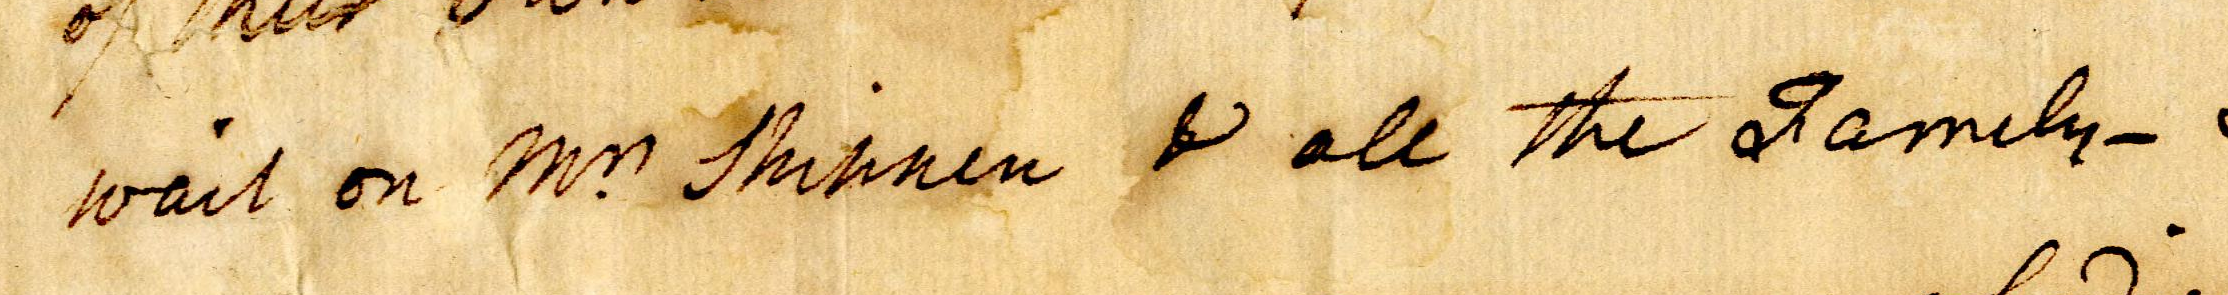wait on M^rs. Shippen & all the Family-
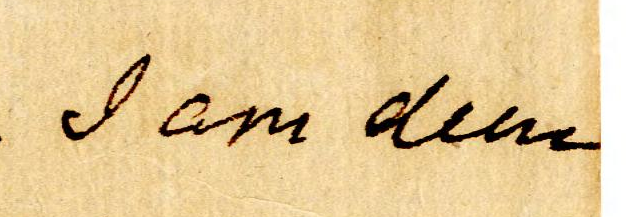I am dear
